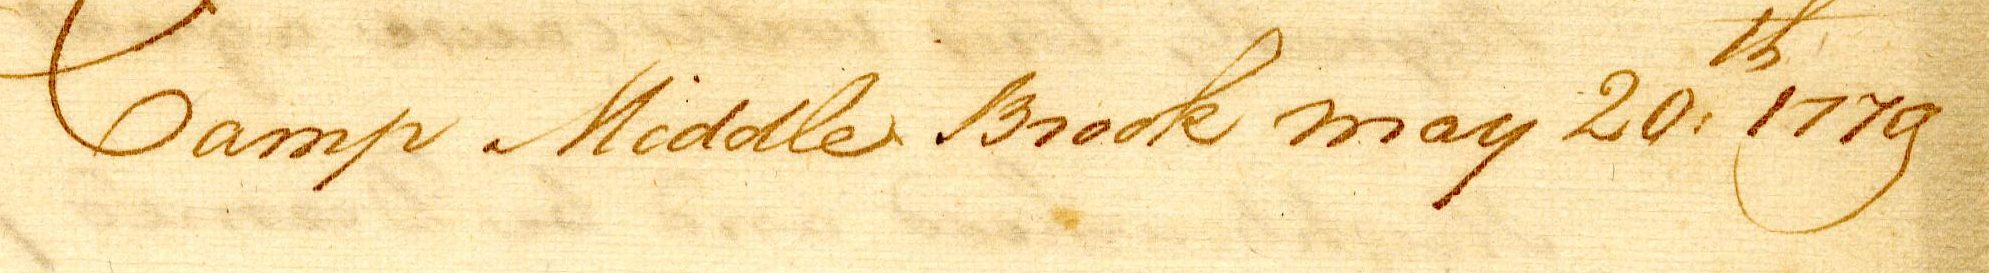Camp Middle Brook May 20^th. 1779
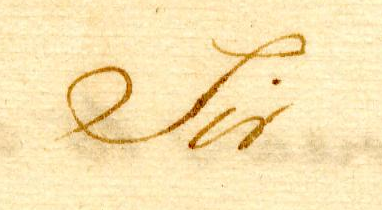Sir
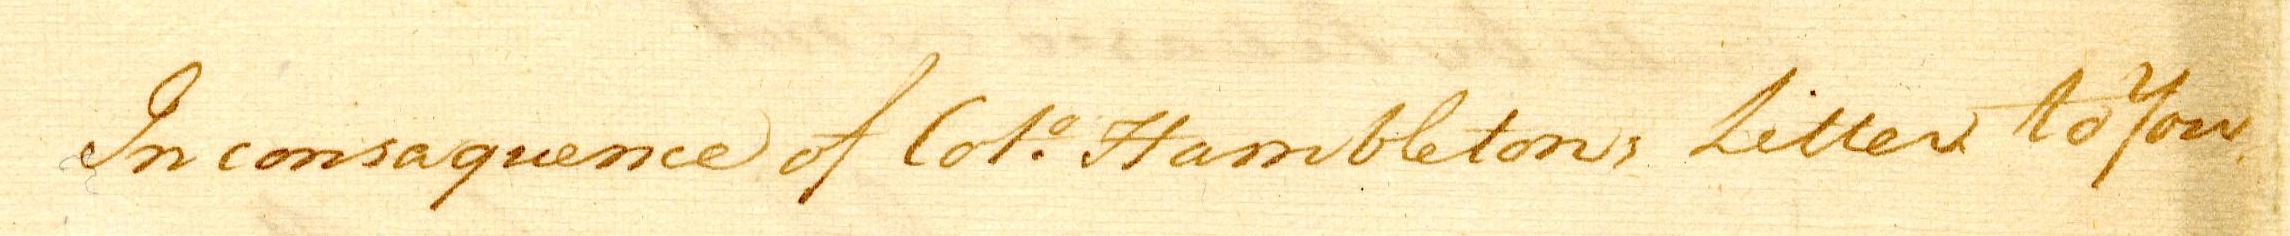In consaquence of Col^o. Hambleton's Letter to You
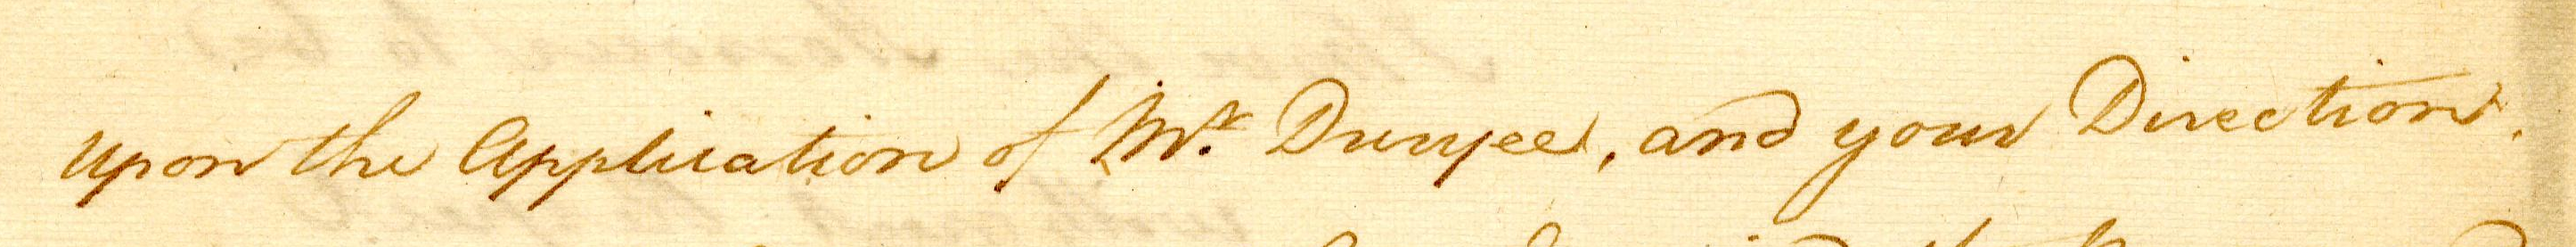upon the Application of M^r. Duryee, and your Directions
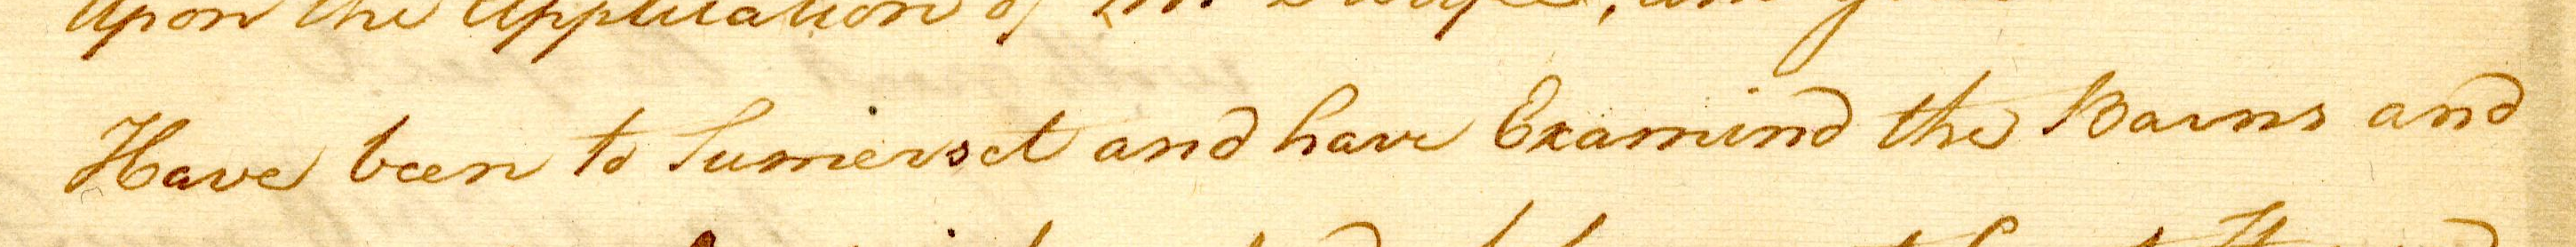Have been to Sumerset and have Examined the Barns and
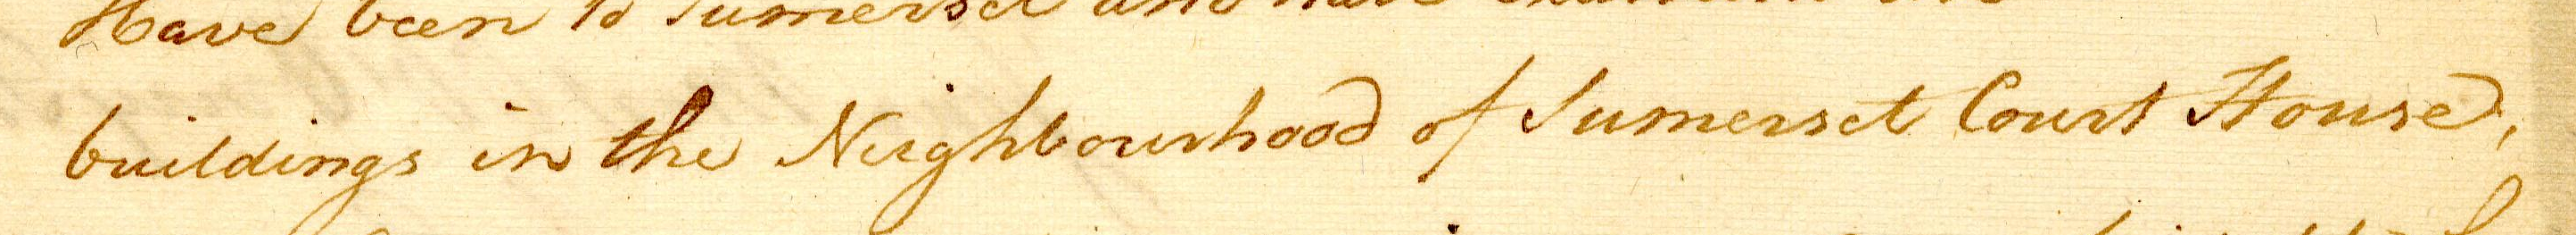buildings in the Neighbourhood of Sumerset Court House,
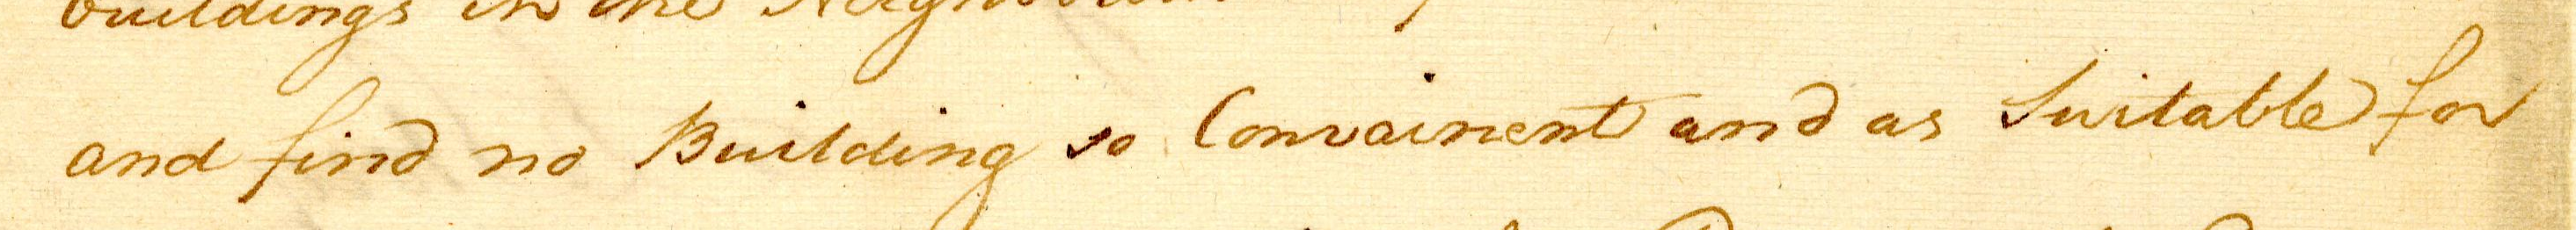and find no Building so Convainent and as suitable for
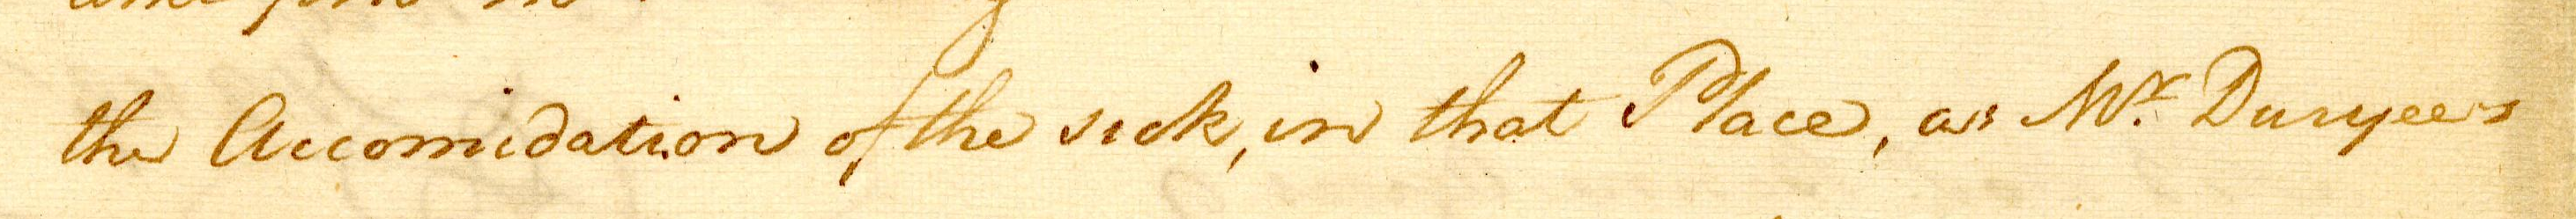the Accomidation of the sick, in that Place, as M^r. Duryees
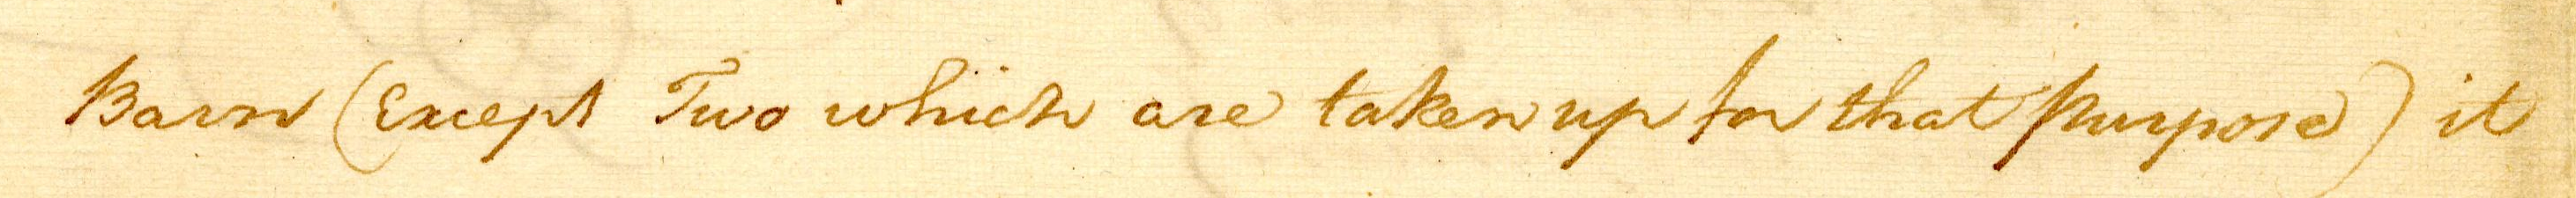Barn (Except Two which are taken up for that purpose) it
